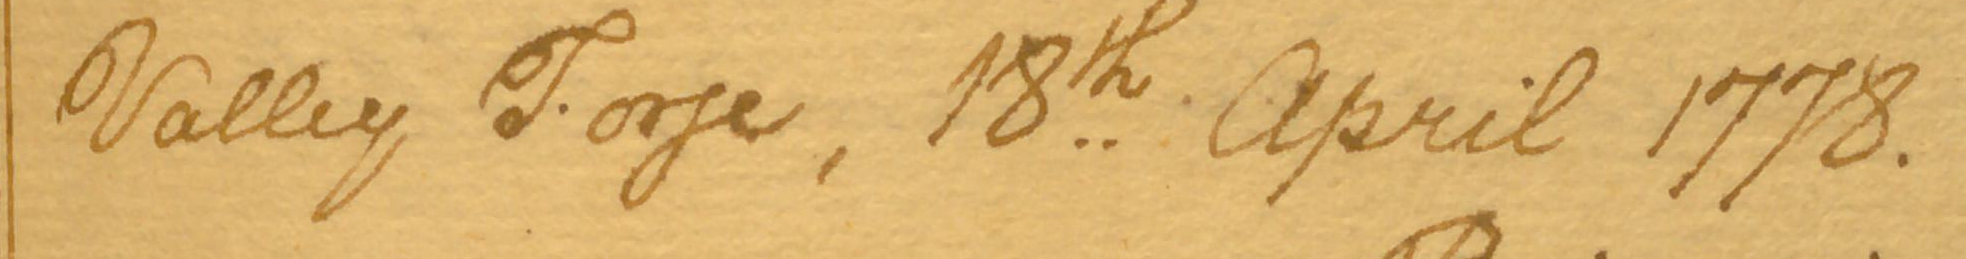Valley Forge, 18^th. April 1778.
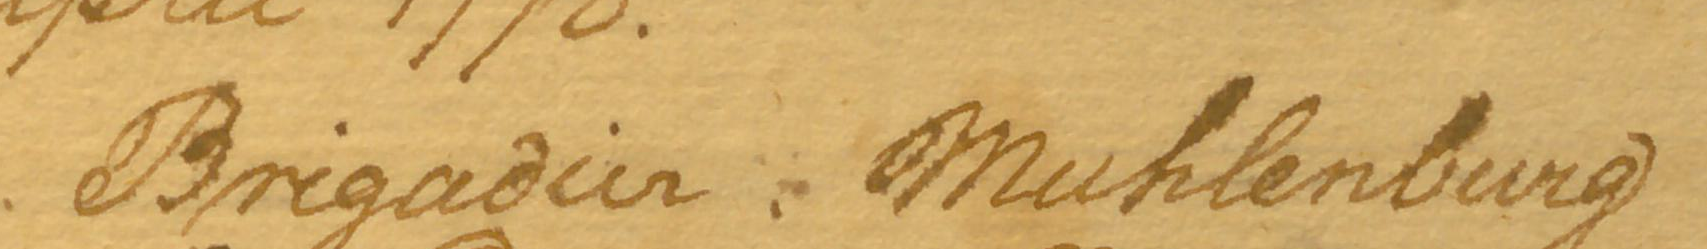Brigadier. Muhlenburg
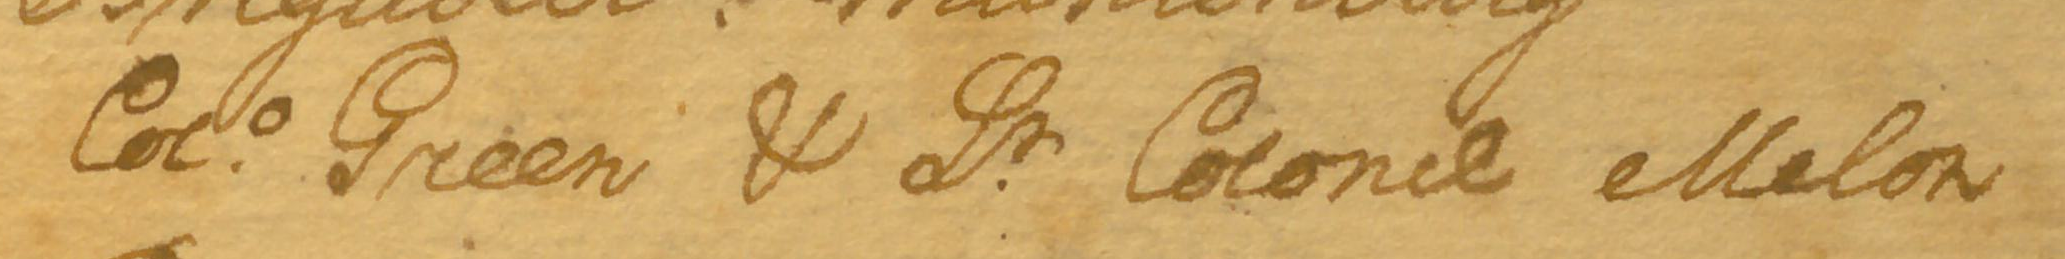Col^o. Green & L^t. Colonel Melon
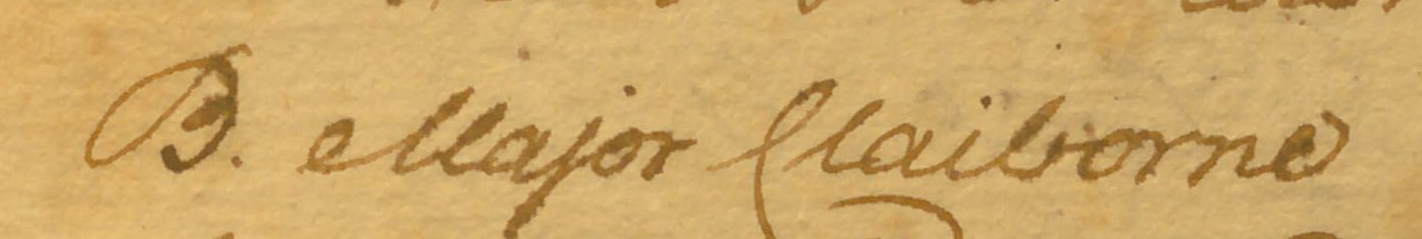B. Major Claiborne
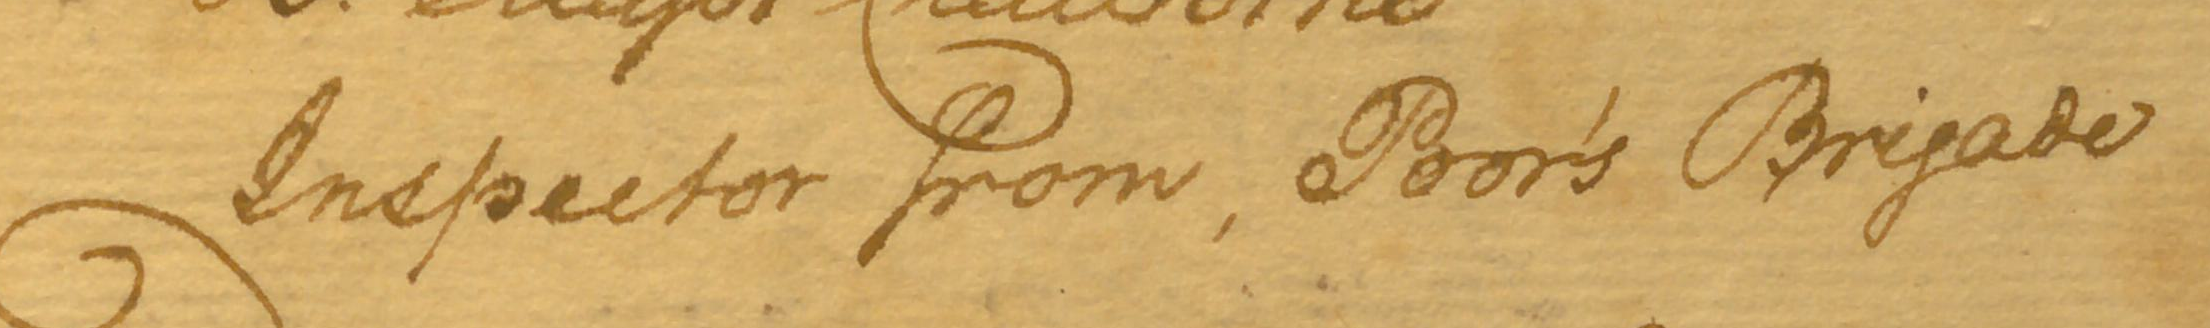Inspector from Poor's Brigade
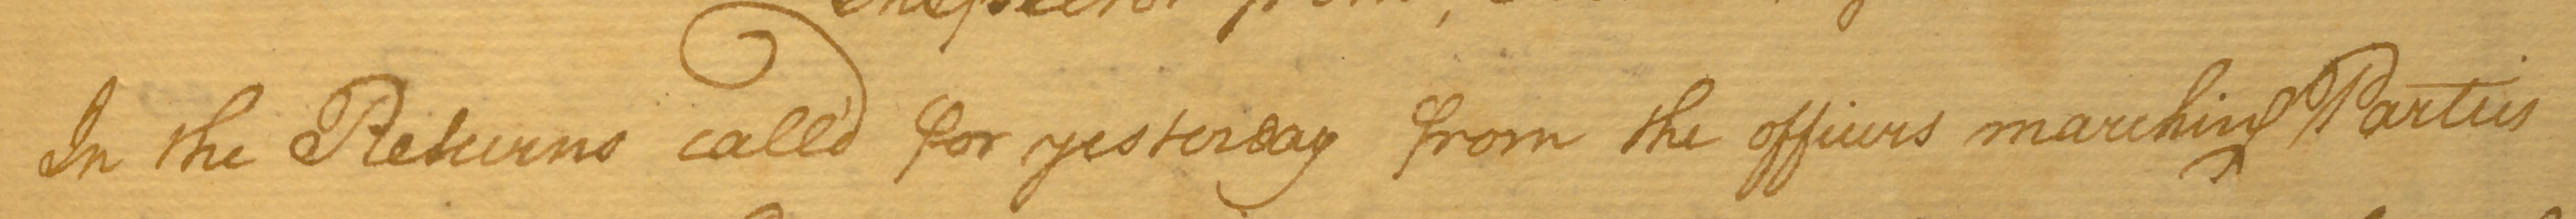In the Returns call'd for yesterday from the officers marching Parties
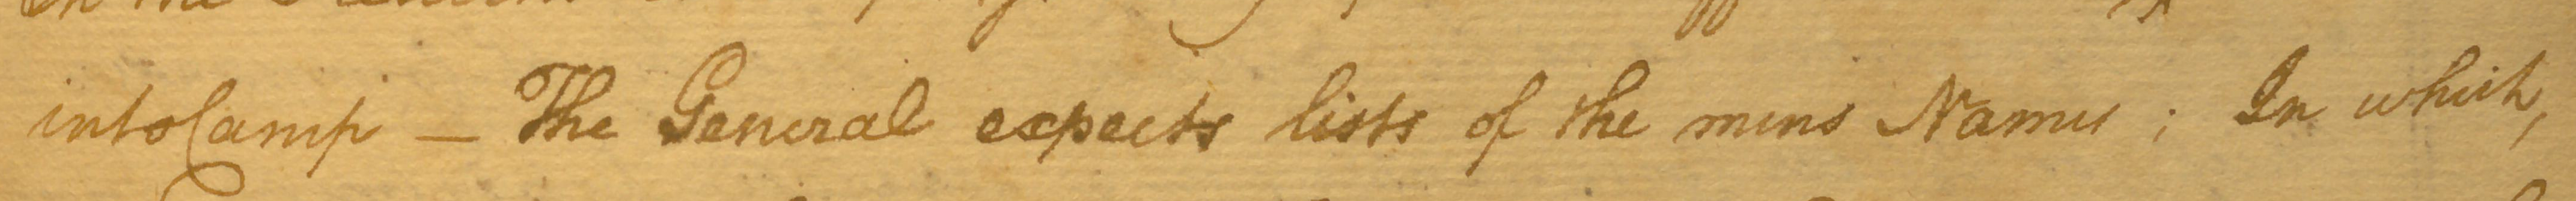into Camp- The General expects lists of the mens Names; In which,
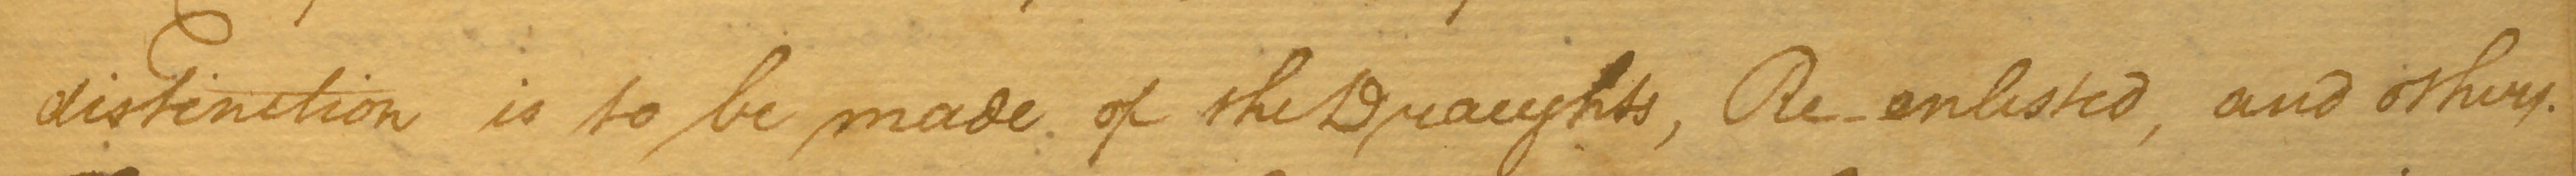distinction is to be made of the Draughts, Re-enlisted, and others.
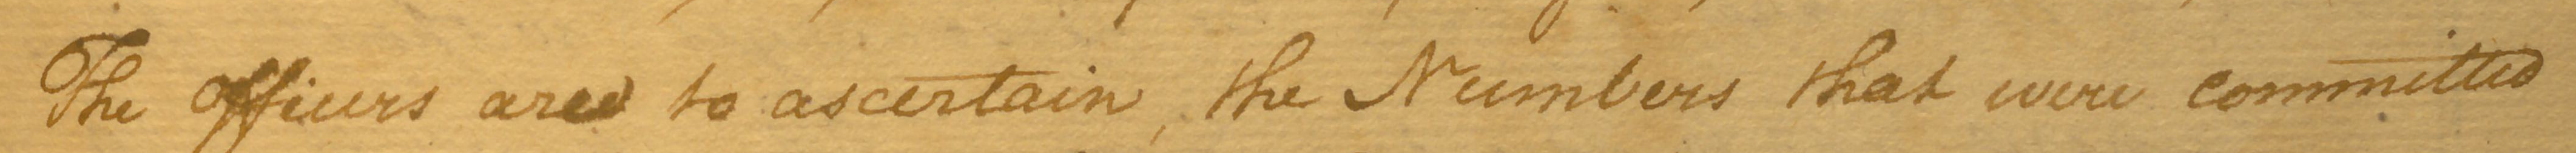The officers are to ascertain the Numbers that were committed
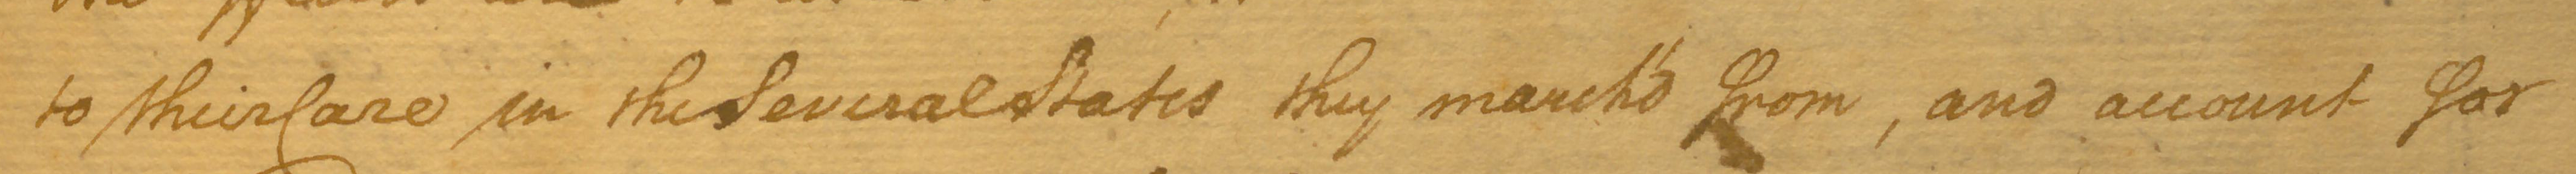to their care in the several States they march'd from, and account for
